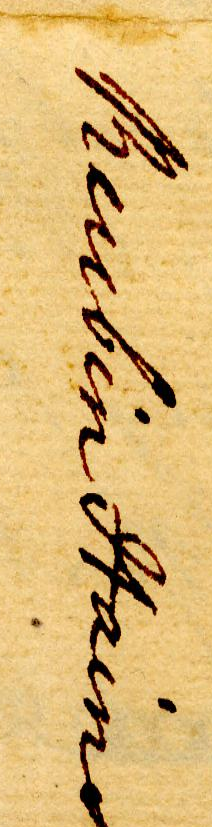Reubin Hains
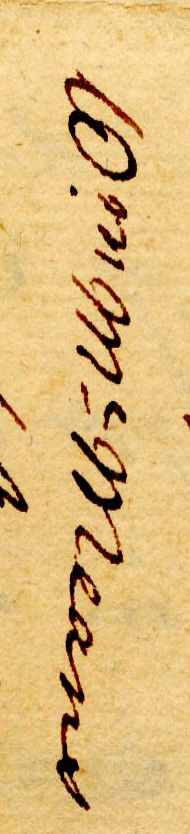W^m. M^cMeans
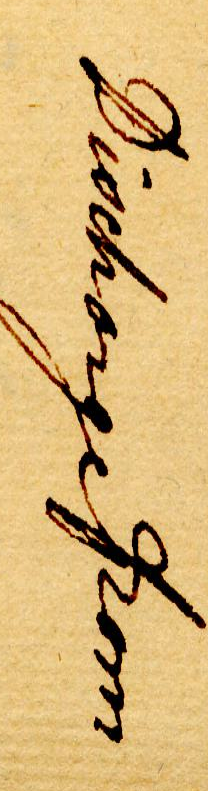Discharge from
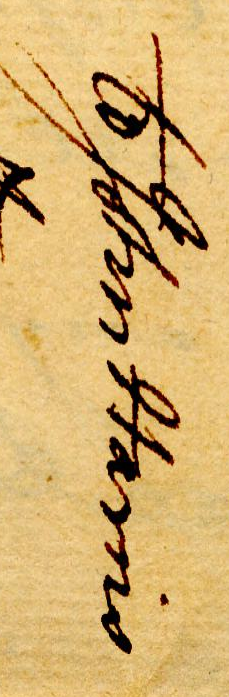to john Hains
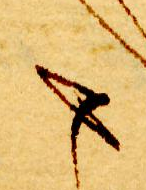&
